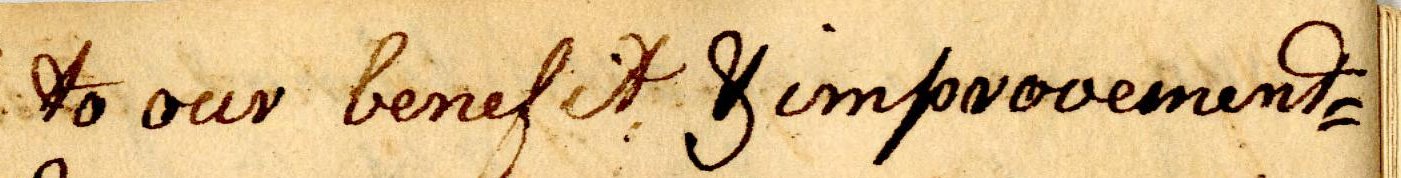to our benefit & improvement-
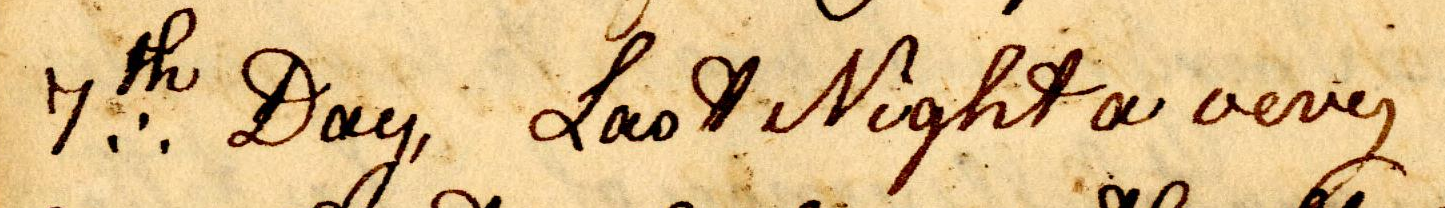7^th Day, Last Night a very
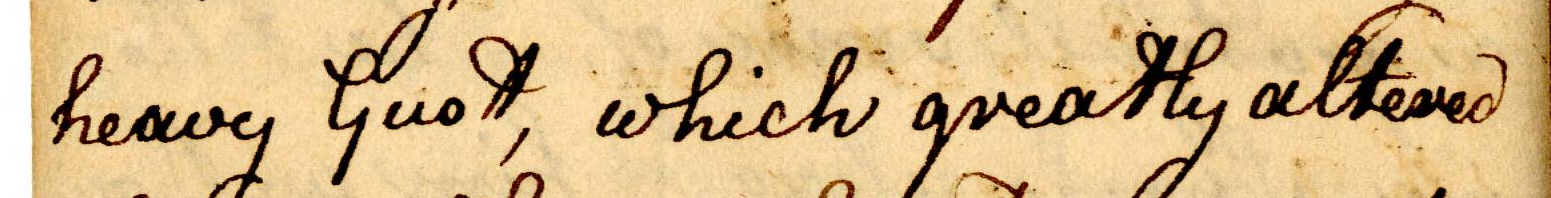heavy Gust, which greatly altered
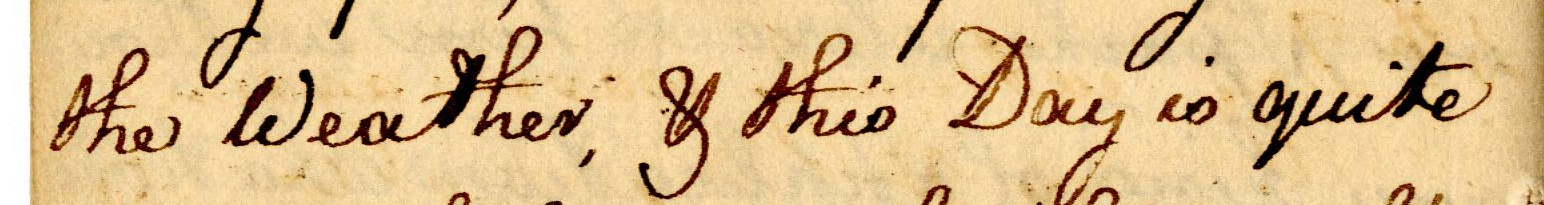the Weather, & this Day is quite
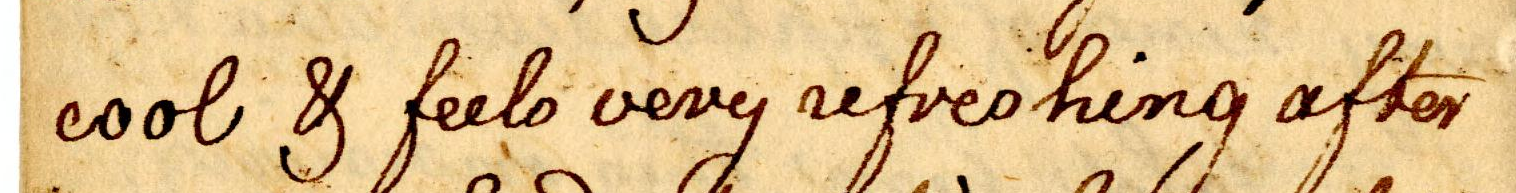cool & feels very refreshing after
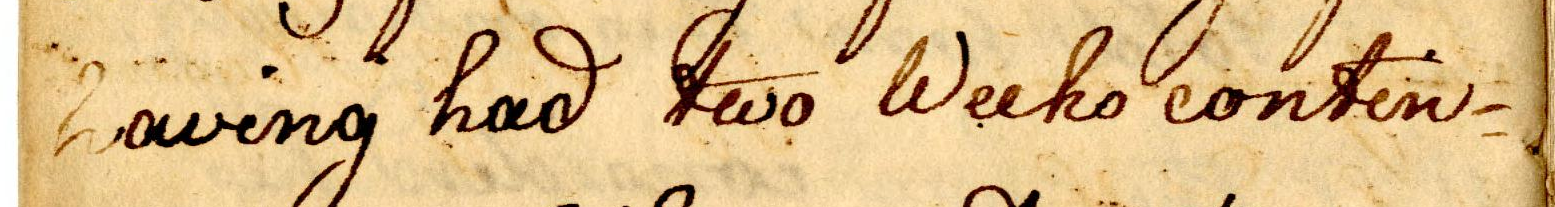having had two Weeks contin-
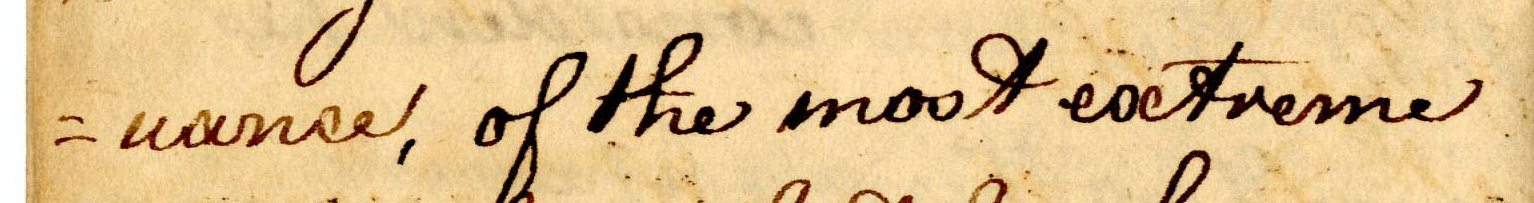-uance, of the most extreme
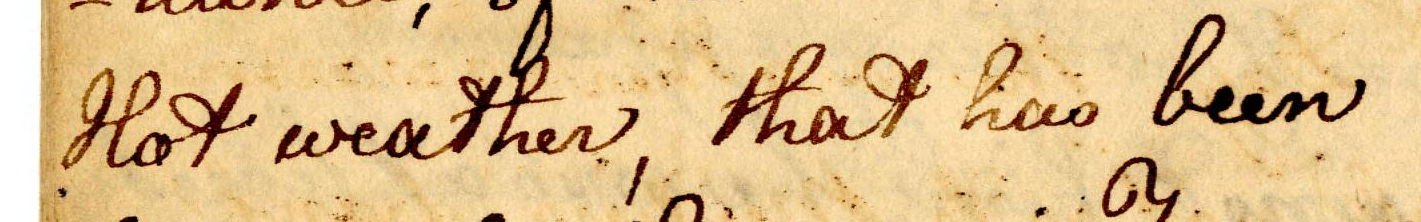Hot weather, that has been
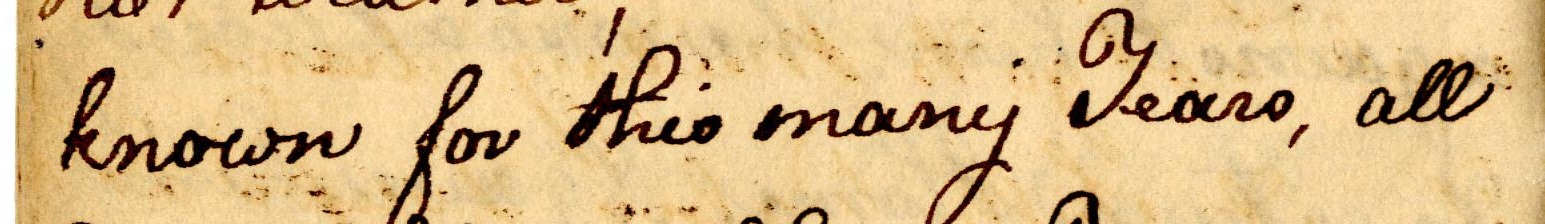known for this many Years, all
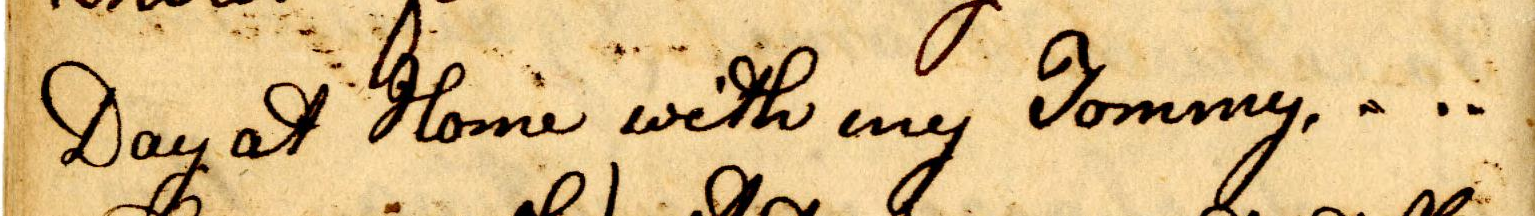Day at Home with my Tommy....
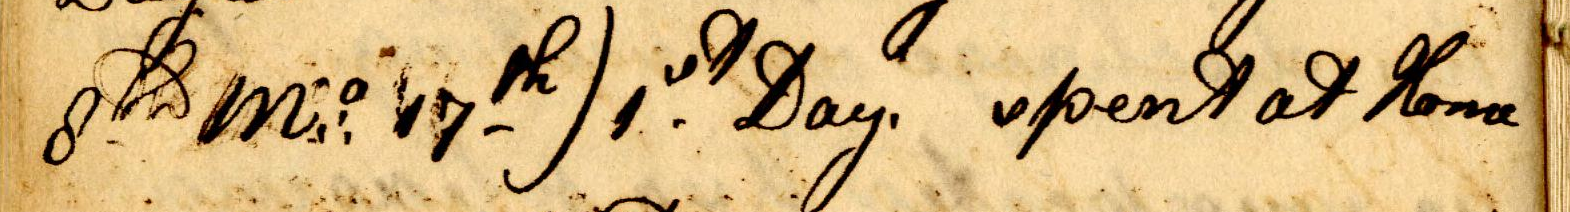8^th M^o 17^th ) 1^st Day. spent at Home
